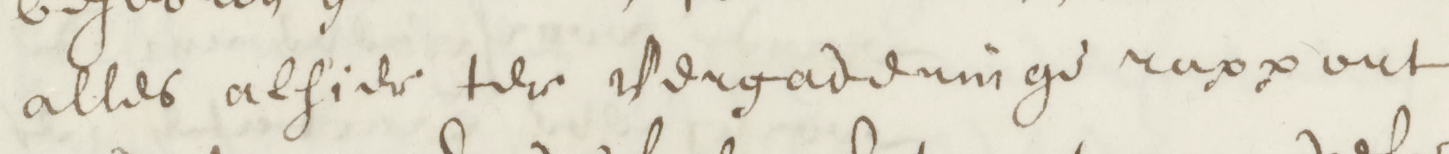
alles alhier ter Vergaderinge rapport
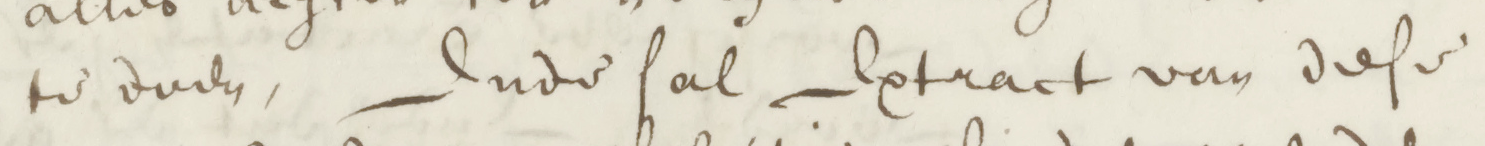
te doen, Ende sal Extract van dese
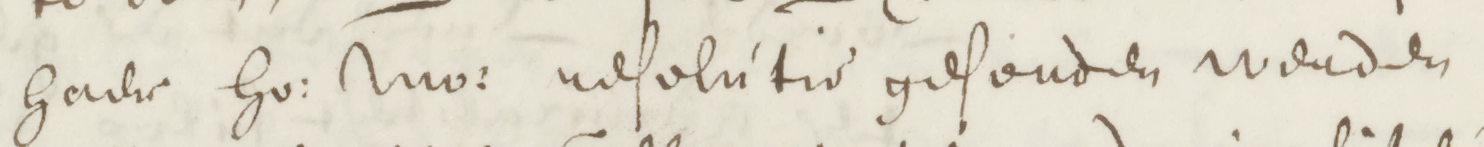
haer ho:mo: resolutie gesonden werden
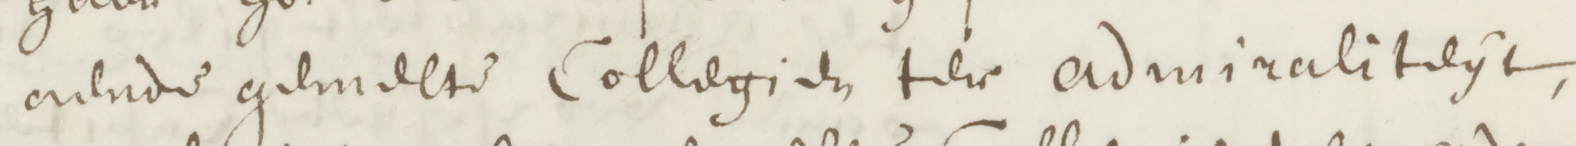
aende gemelte Collegien ter admiraliteijt,
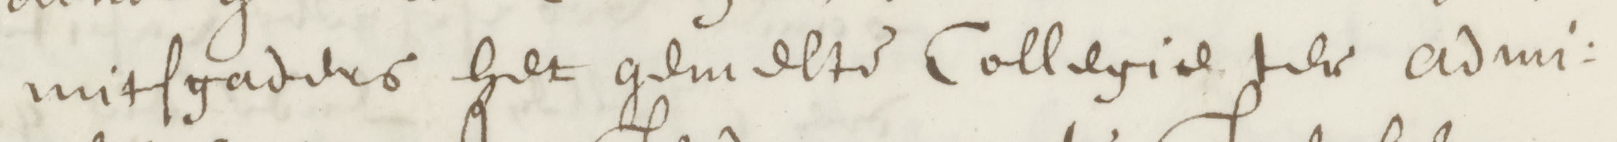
mitsgaders het gemelte Collegie ter admi:
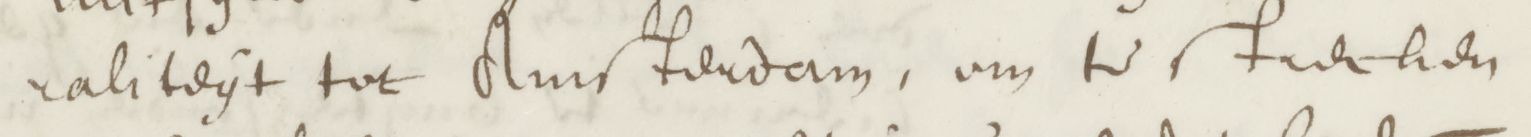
raliteijt tot Amsterdam, om te strecken
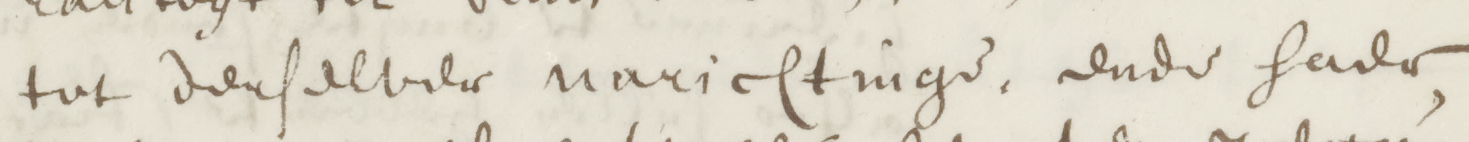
tot derselver narichtinge, ende haer
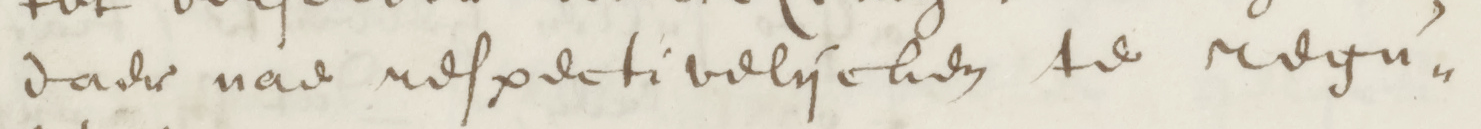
daer nae respectivelijcken te regu„
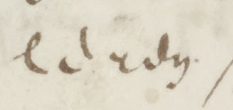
leren.
